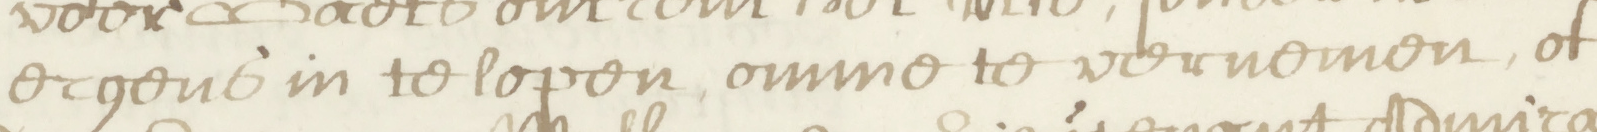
ergens in te lopen, omme te vernemen, of
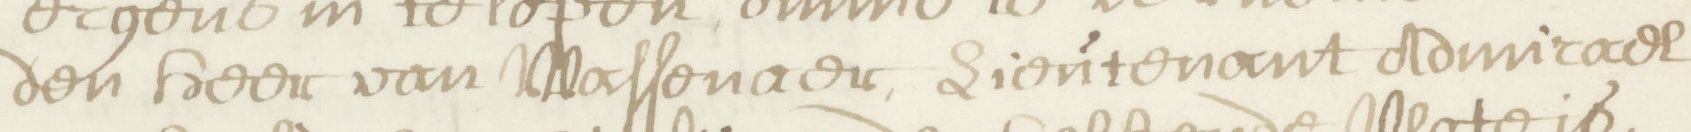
den heer van Wassenaer, Lieutenant Admirael
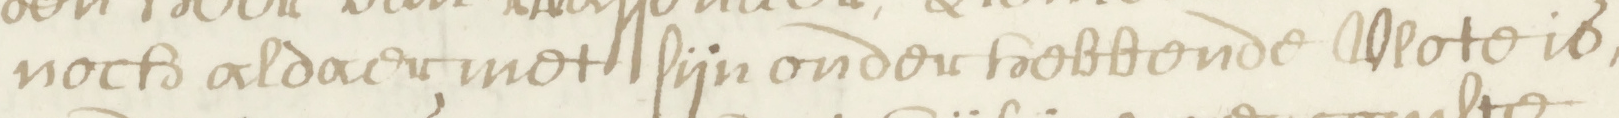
noch aldaer met sijn onderhebbende Vlote is,
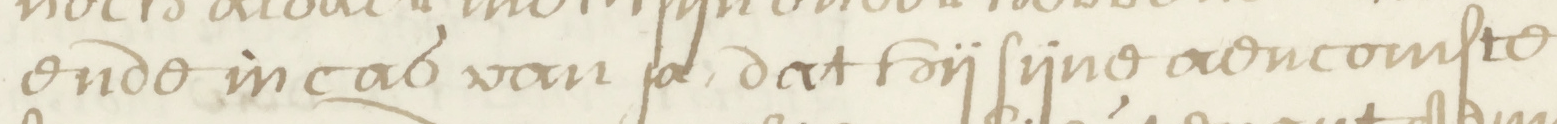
ende in cas van ja, dat hij sijne aencomste
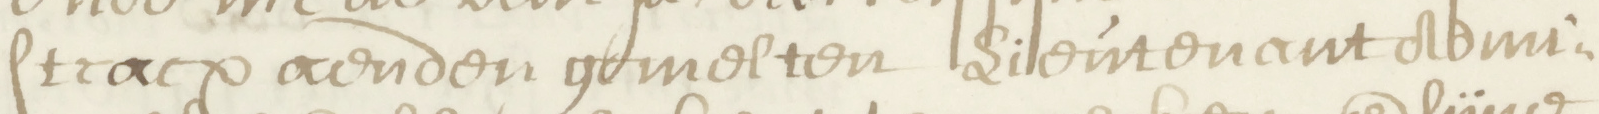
stracx aenden gemelten Lieutenant Admi,,
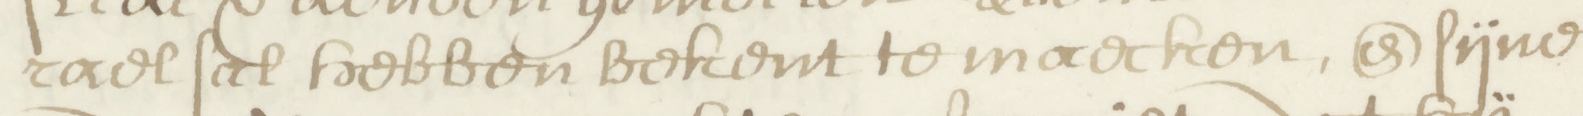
rael sal hebben bekent te maecken, & sijne
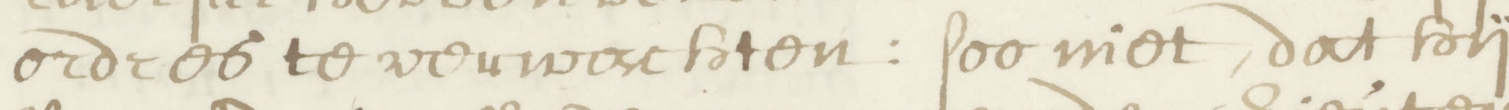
ordres te verwachten: soo niet, dat hij
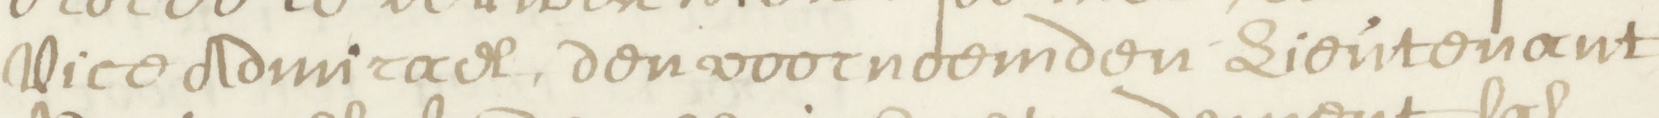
Vice Admirael, den voornoemden Lieutenant
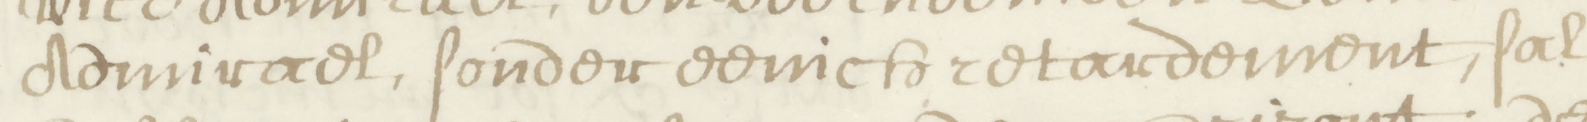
Admirael, sonder eenich retardement, sal
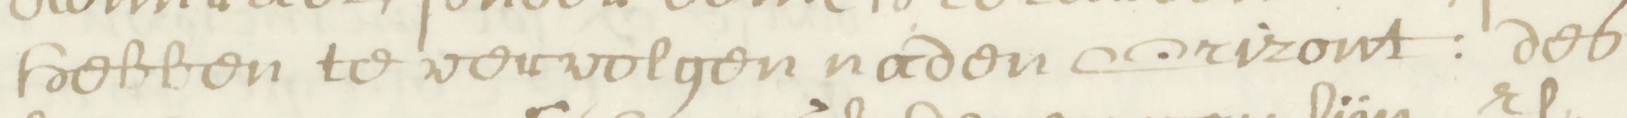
hebben te vervolgen naden Orizont: des
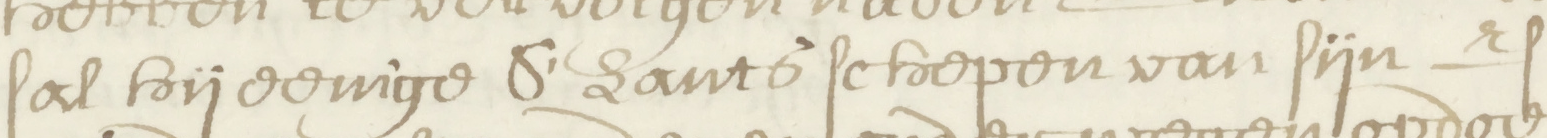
sal hij eenige S‛ Lants schepen van sijn Es„
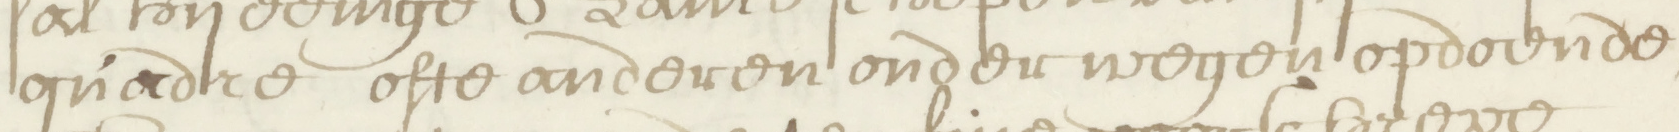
quadre ofte anderen onder wegen opdoende,
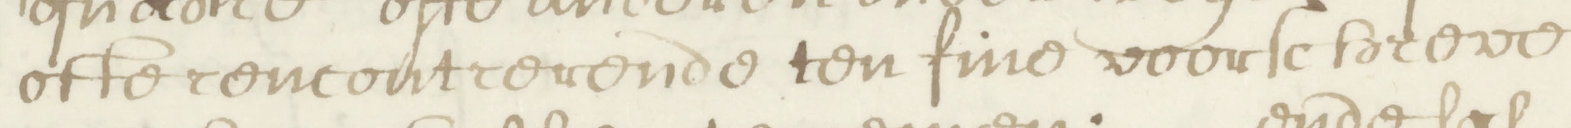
ofte rencontrerende ten fine voorschreve
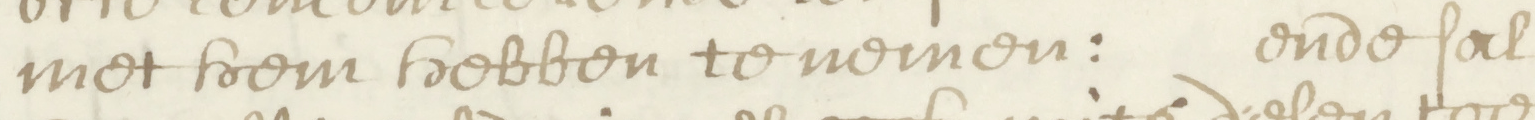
met hem hebben te nemen: ende sal
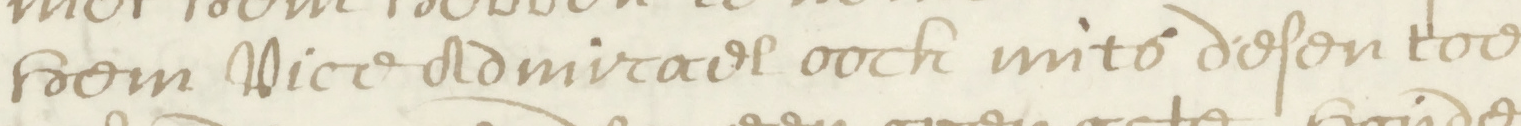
hem Vice Admirael oock mits desen toe
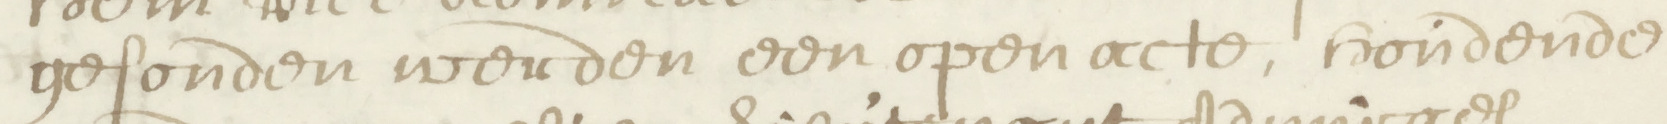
gesonden werden een open acte, houdende
